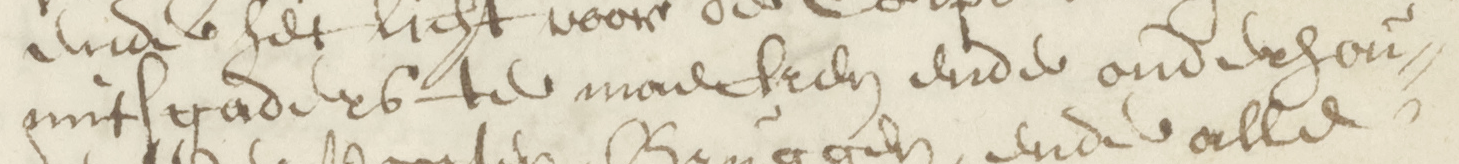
mitsgaders te maecken ende onderhou„
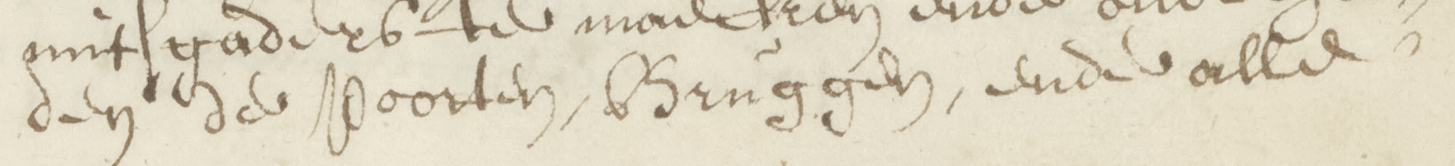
den de Poorten, Bruggen, ende alle
